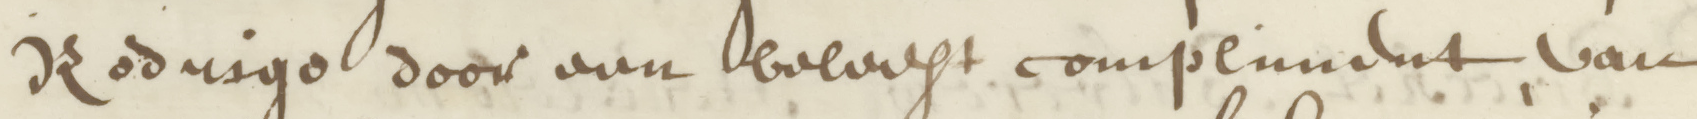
Rodrigo door een beleeft compliment van
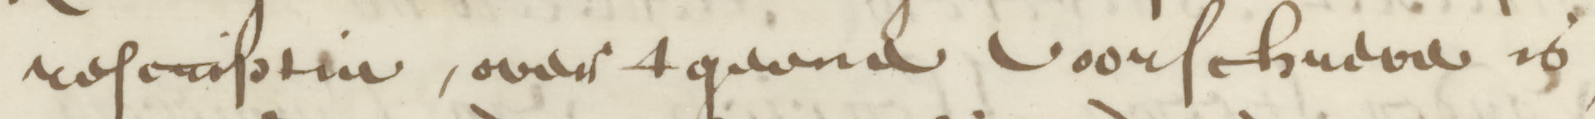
rescriptie, over tgeene voorschreve is
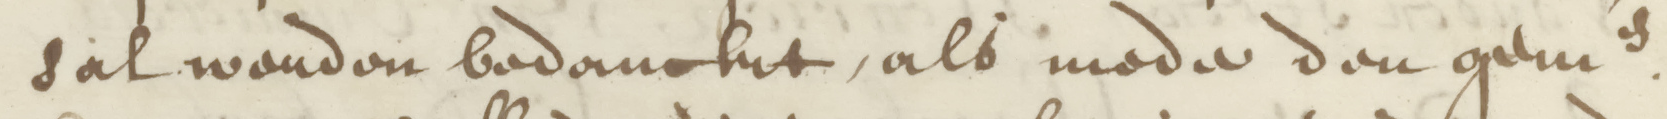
sal werden bedanckt, als mede den gemen.
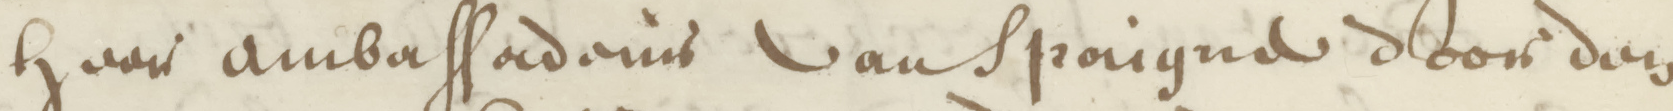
heer Ambassadeur van Spaigne door den
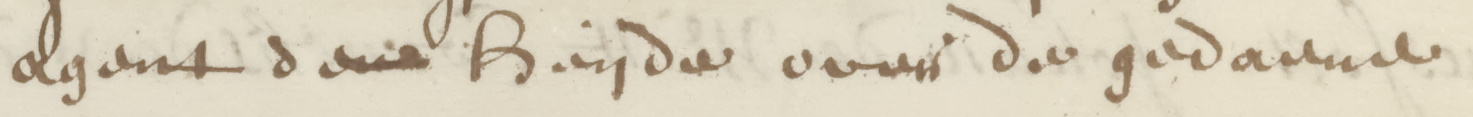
agent den Heijde over de gedaene
